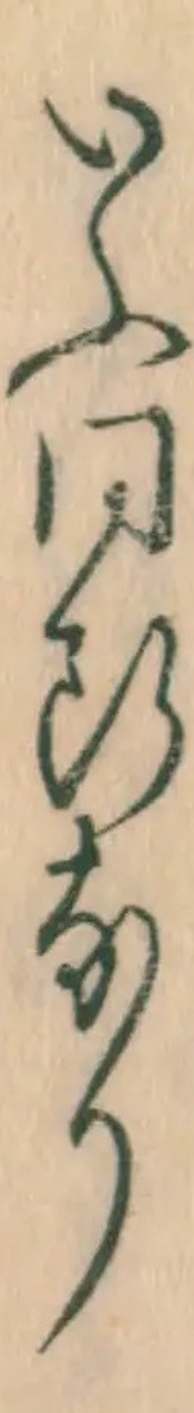いふ同断なり
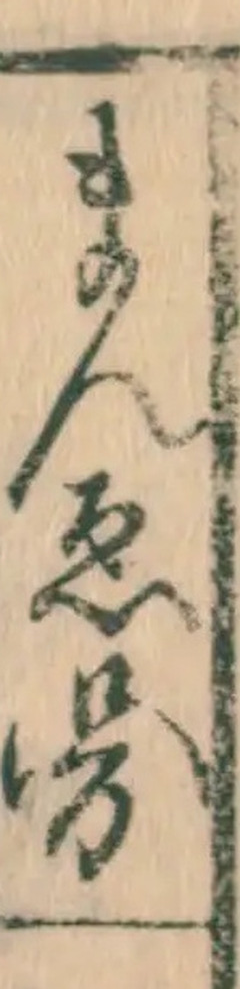まんゑ図
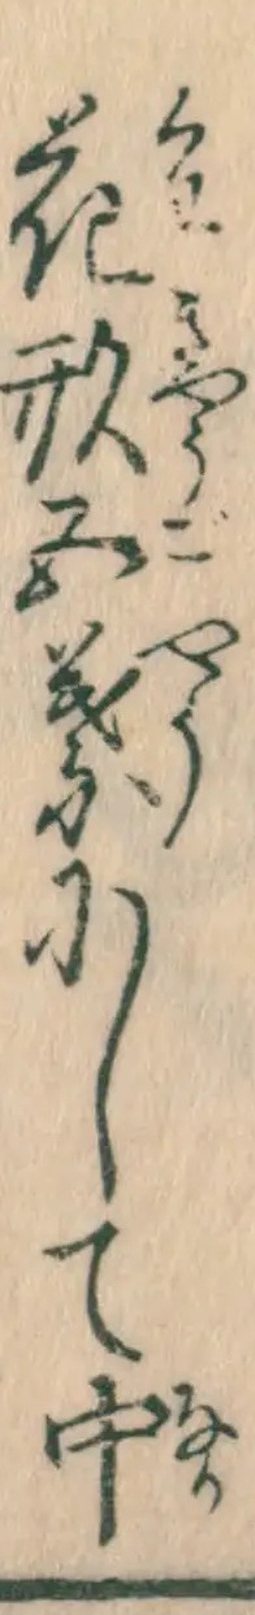花形五葉にして中
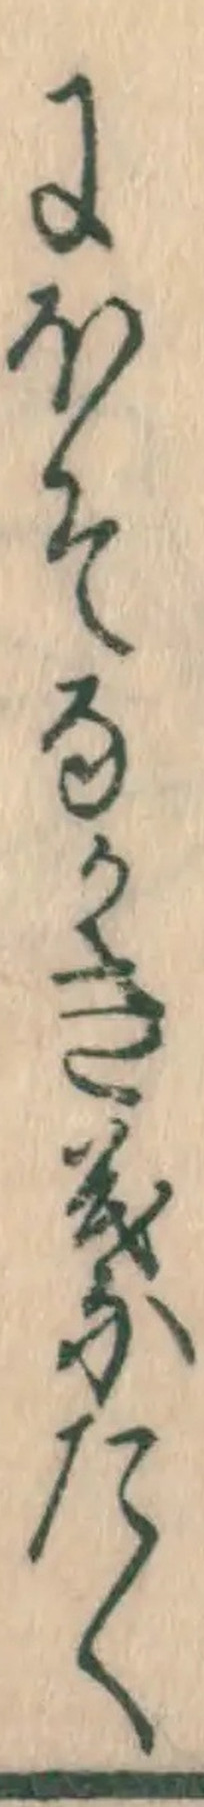にほそなかき葉たく
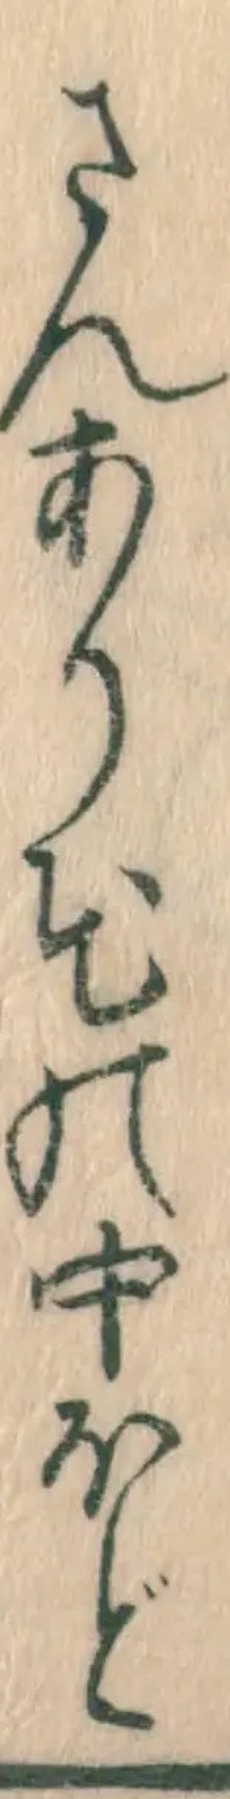さんあり花の中ほど
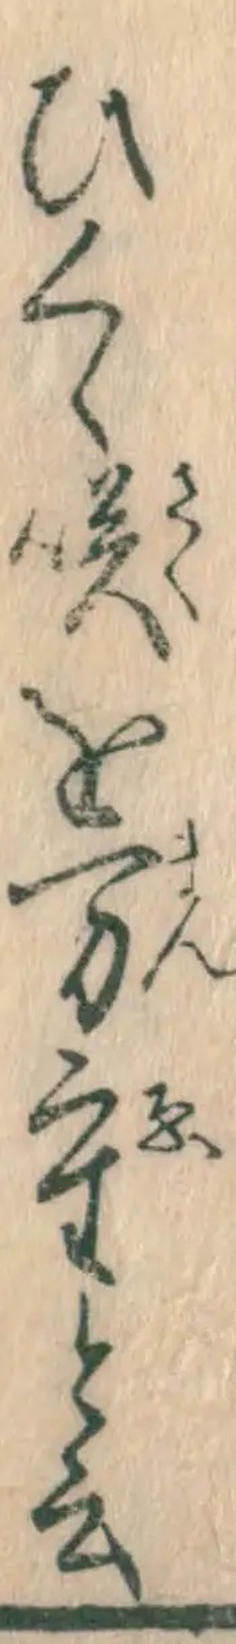ひくゝ咲を万重と云
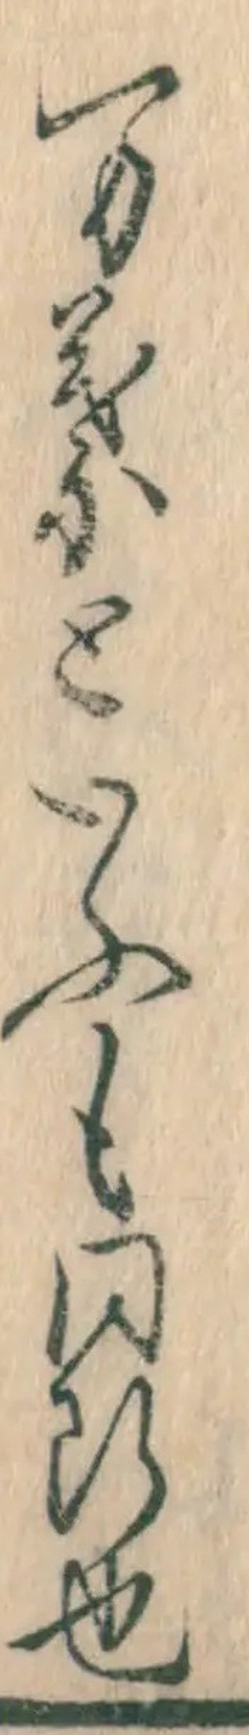万葉といふも同断也

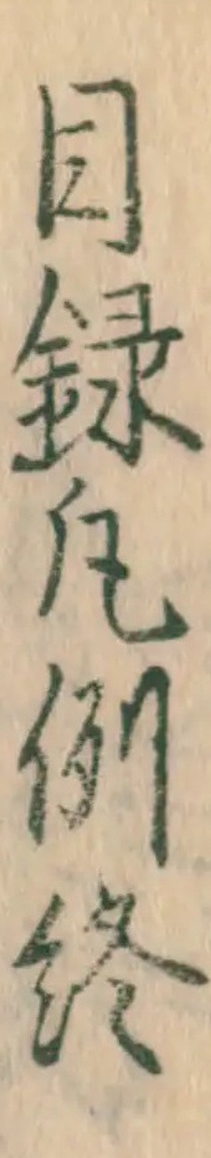目録凡例終
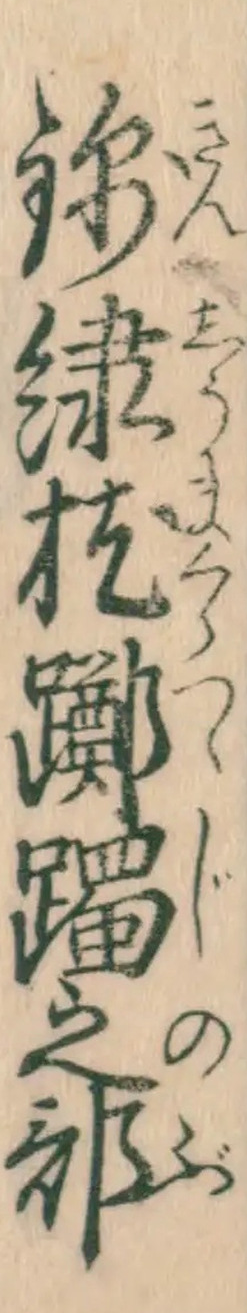錦繍枕躑躅之部
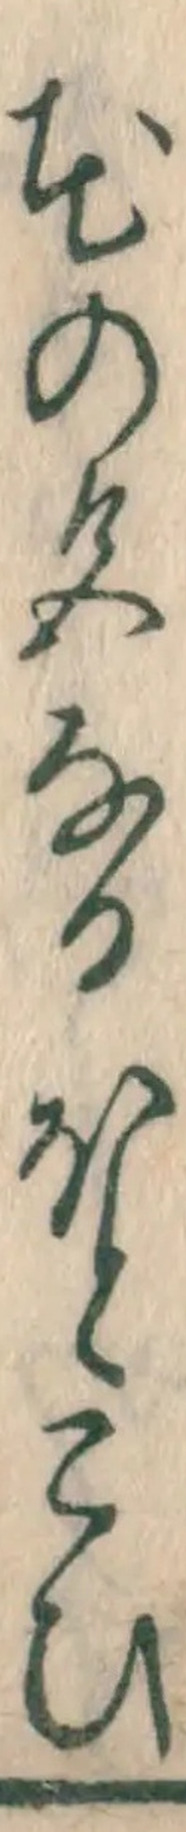花の色なるほとこひ
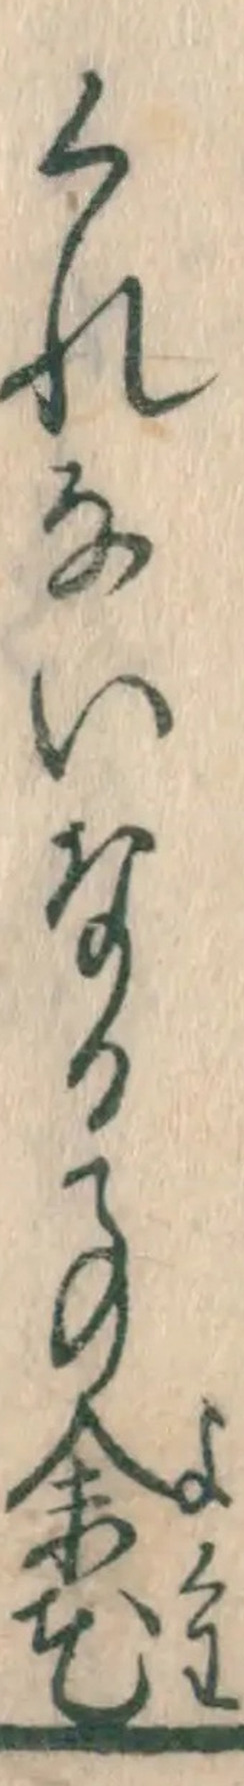くれないなる事余花
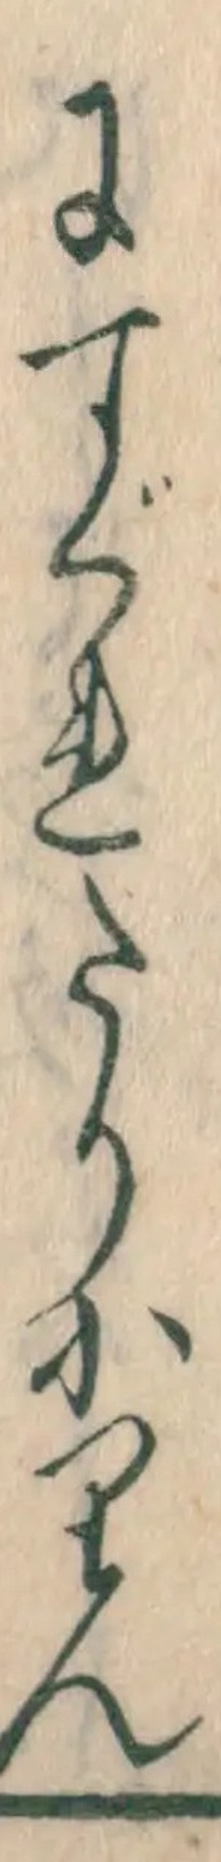にすぐれたり小りん

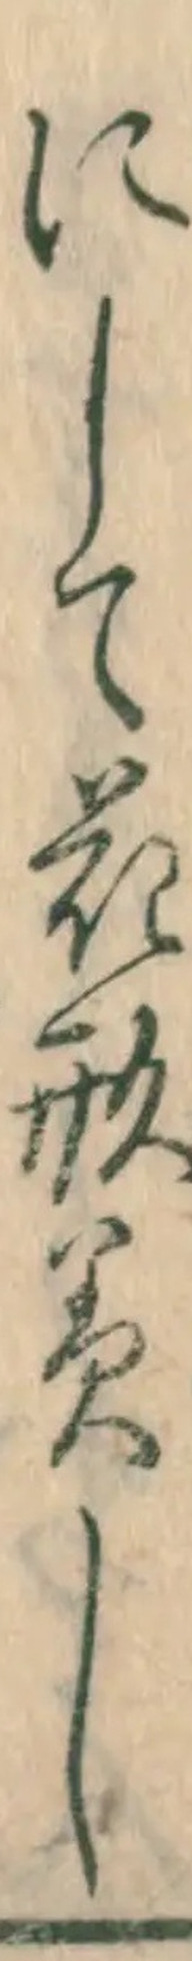にして花形美し
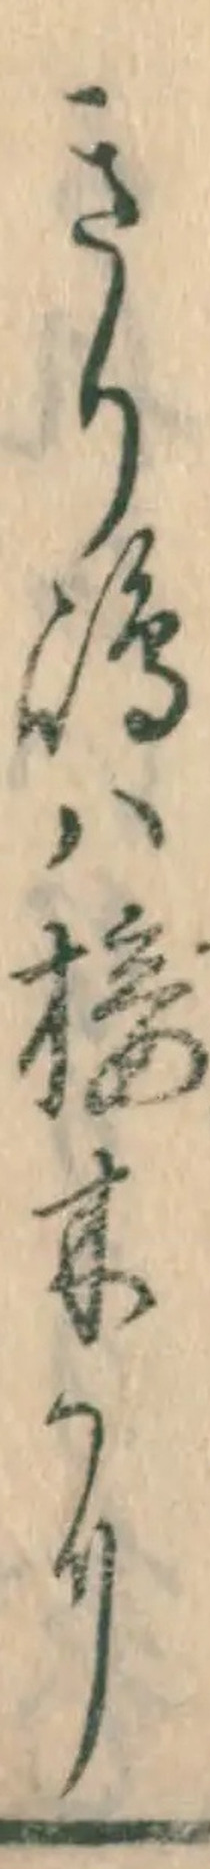きり嶋は接木に
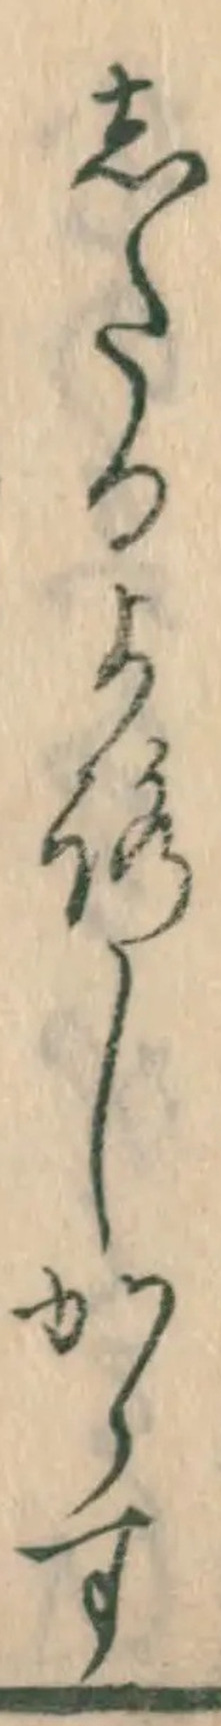したるよろしからす
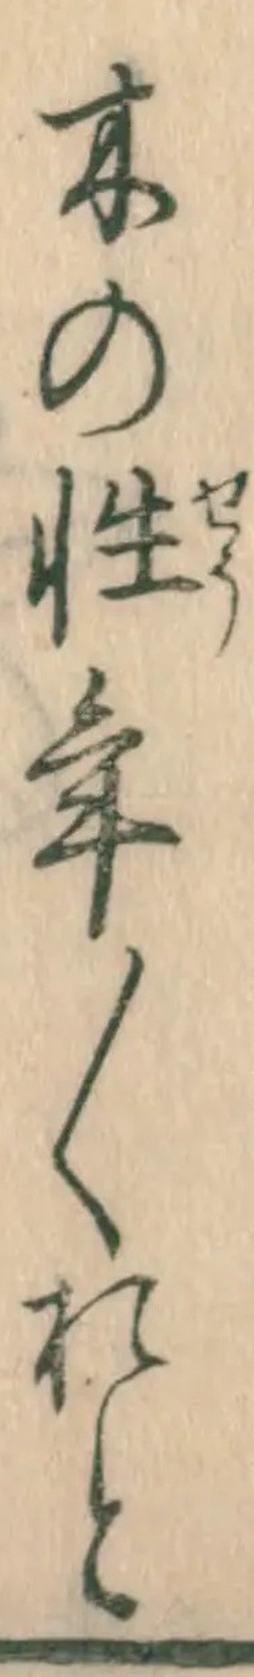木の性年〳〵おと
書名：錦繍枕 5巻. [1]
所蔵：国立国会図書館 National Diet Library, JAPAN
